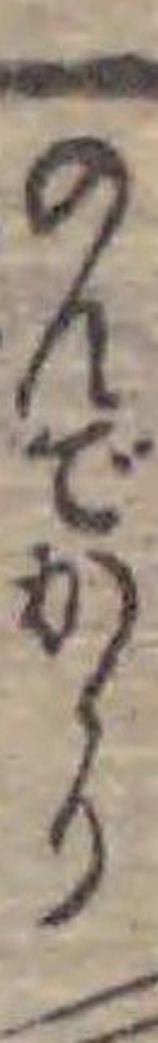のんでかゝり
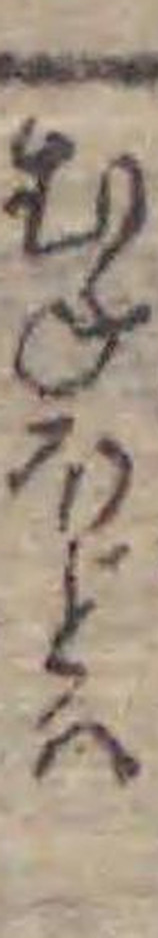むねほどは
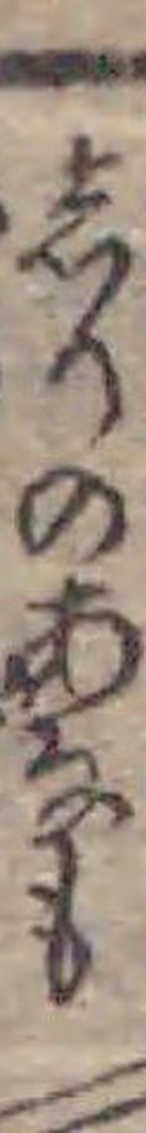しりのあなも
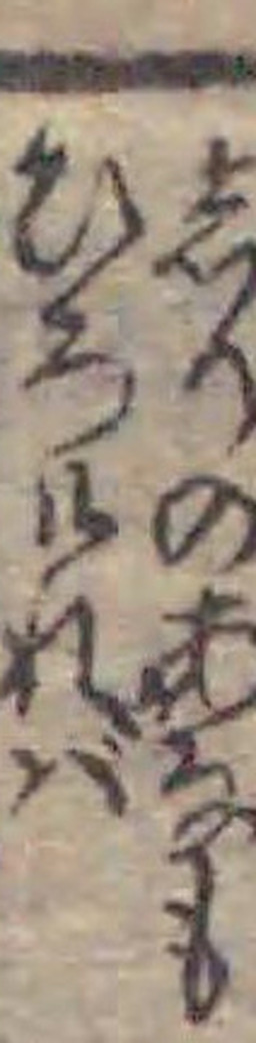ひろければ
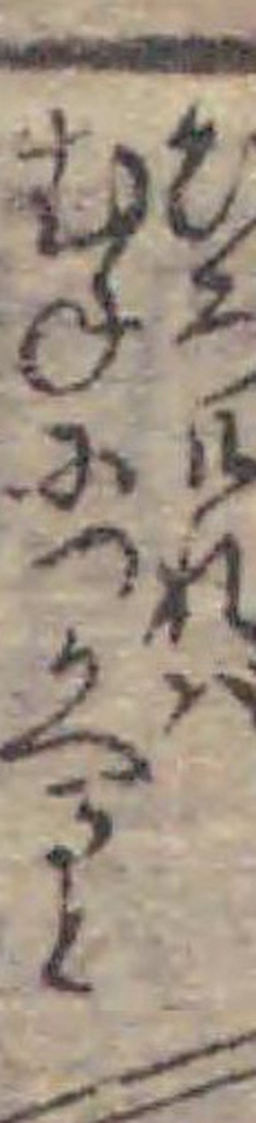むねにつかへると
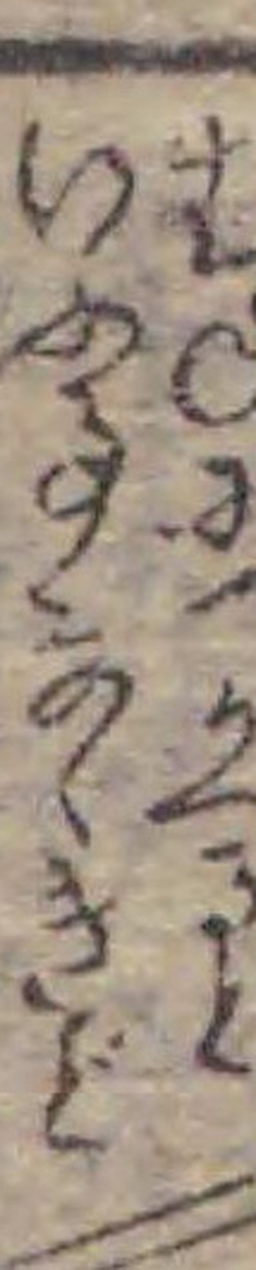いふ事なくきど
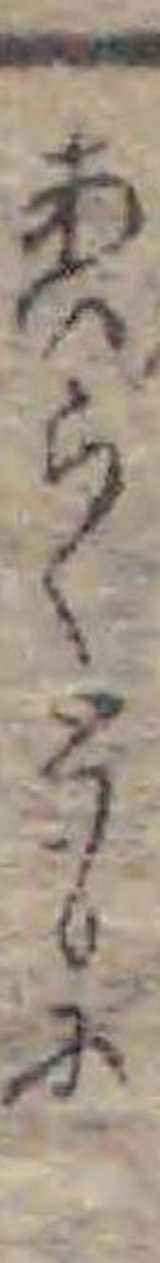あいらくともに
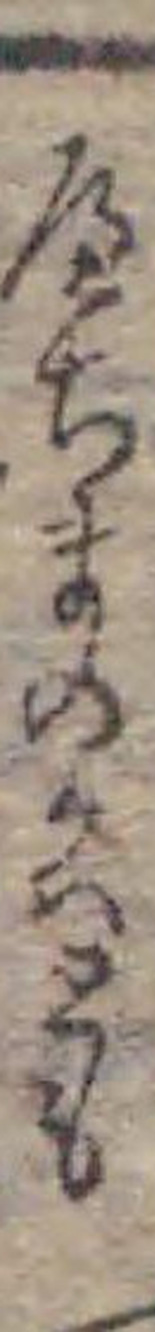へちまのかはとも
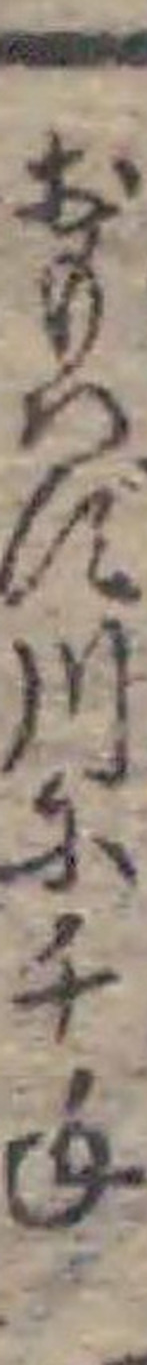おもはず川に千年
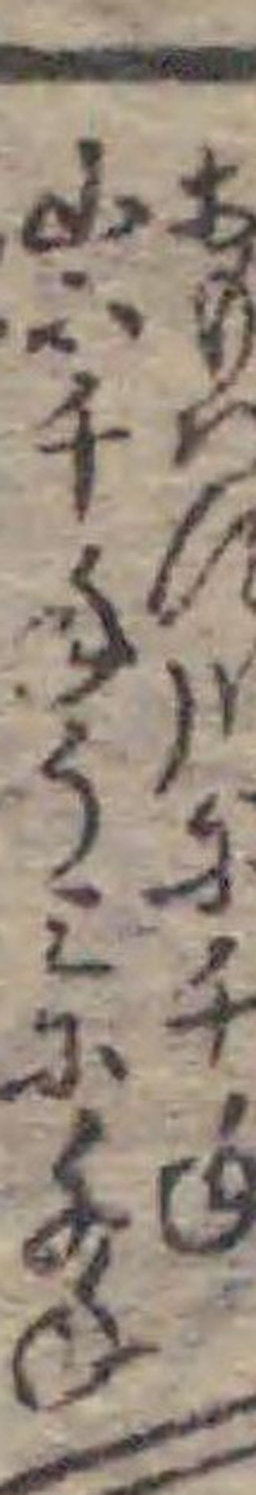山に千年うみに千年
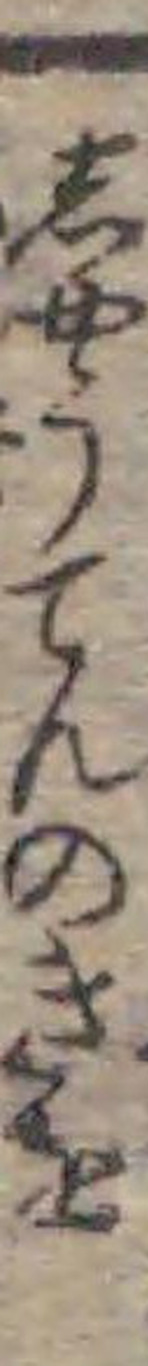しやうてんのきを
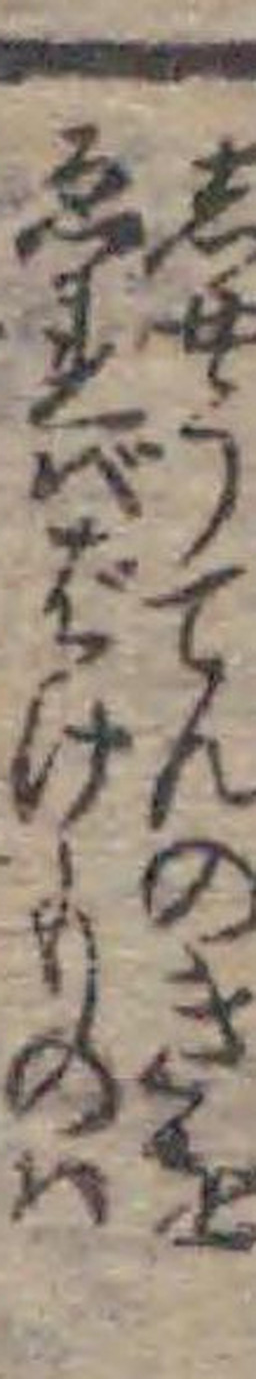ゑればばけものは
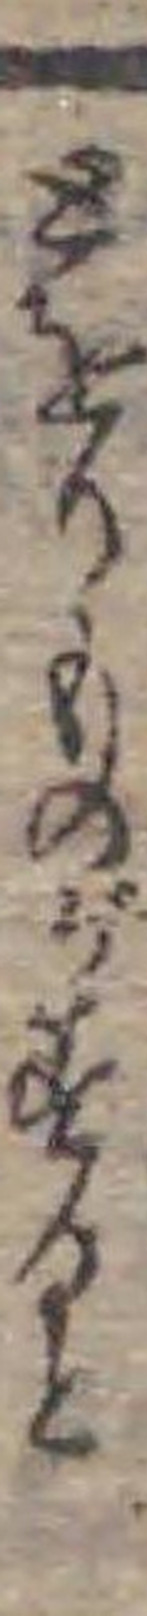とをりものがすると
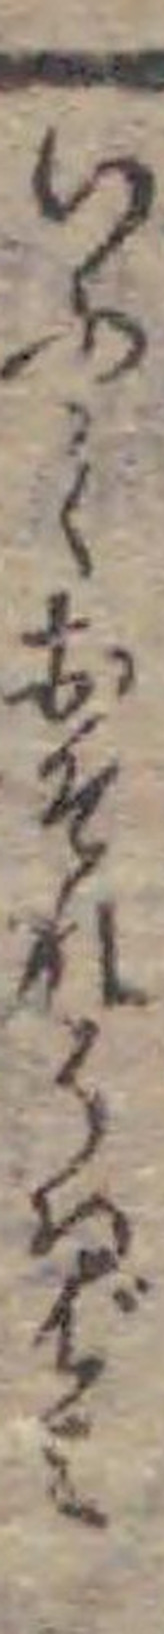いふておそれうはばみ
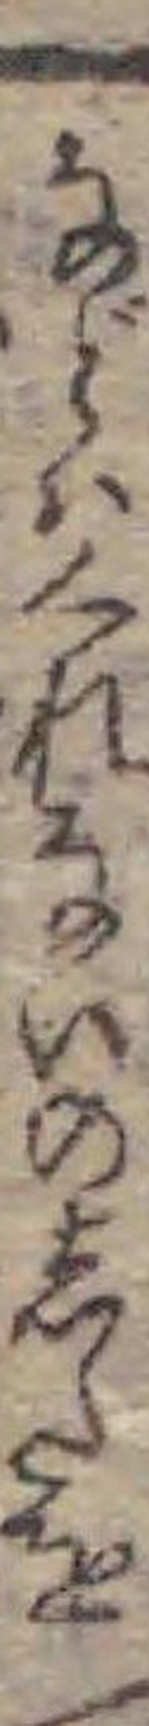などはくれないのしたを
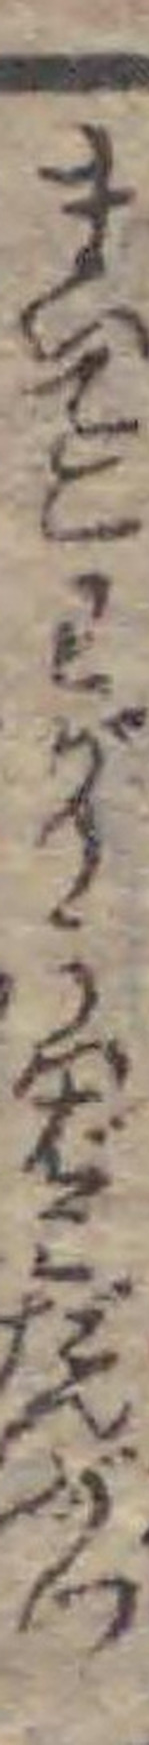まいてこわがりうはばみだんぶつ
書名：怪物つれつれ草 : 2巻
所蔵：国立国会図書館 National Diet Library, JAPAN
